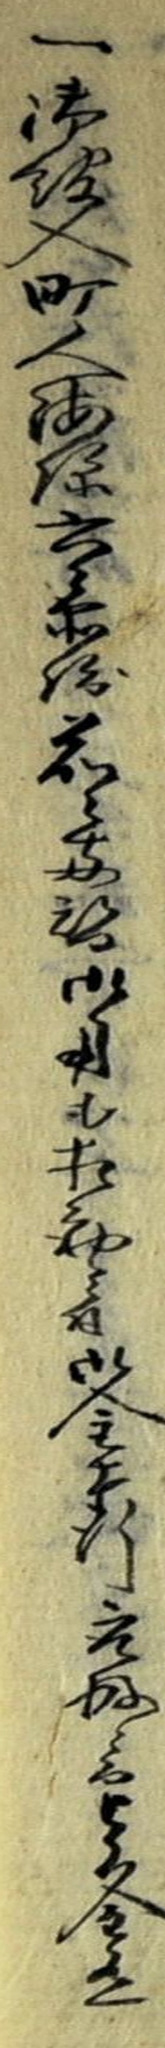一御館入町人海深六兵衛儀前々両替御用も御勤候に付御金奉行取扱に而被下金有

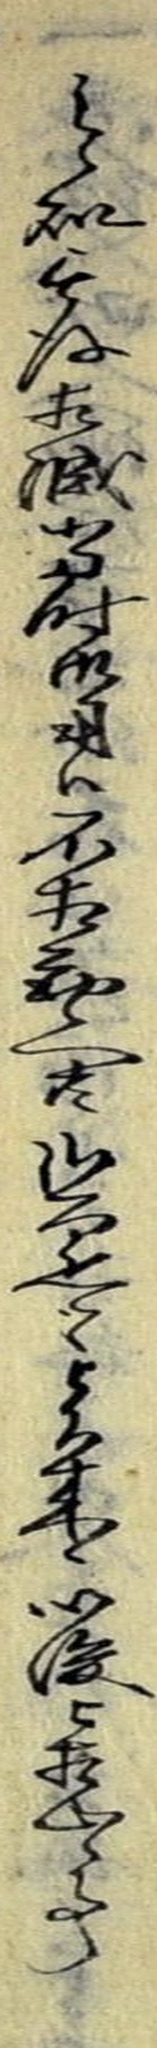之候処其後相減当時御用は不相勤候へ共弐百疋つヽ被下来候以後被相止候事
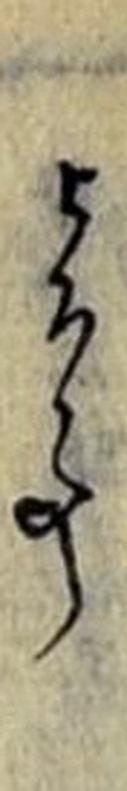被下候事
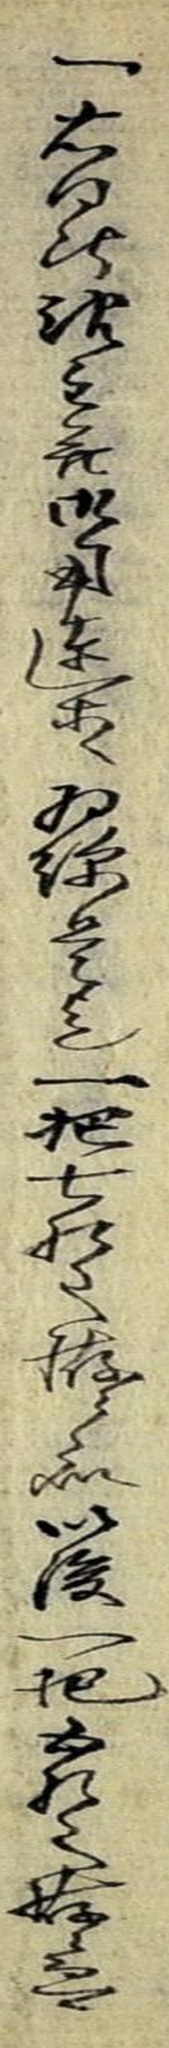一右同断銀主共御用達等へ為綿是迄一把七拾匁拵に候処以後壱把五拾匁之拵に而可
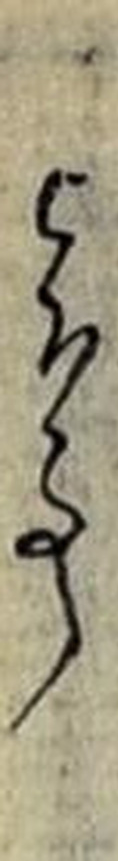被下候事
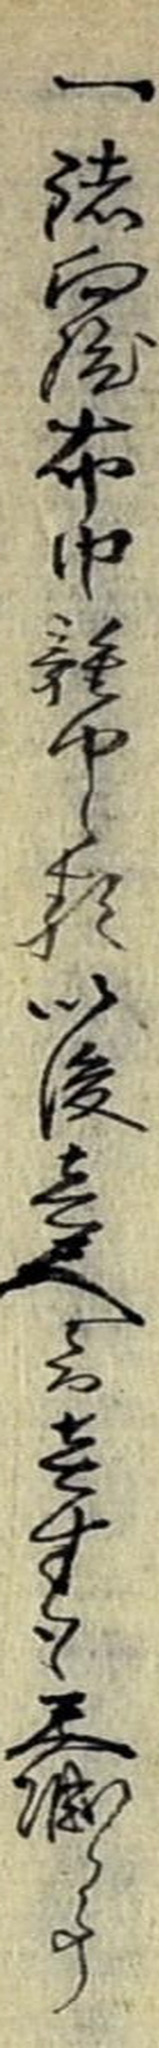一諸向渡布巾雑巾之類以後壱人に而壱寸つヽ尺減候事
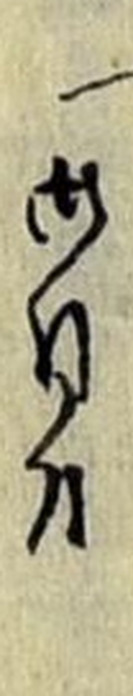御目付
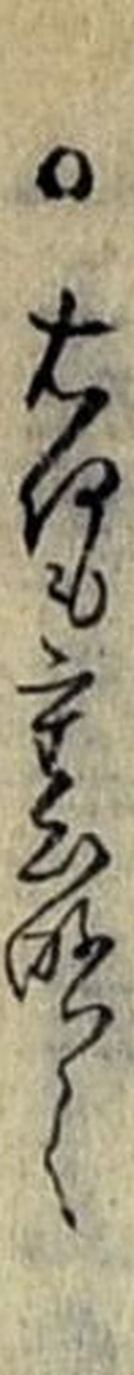○右何も重出略之
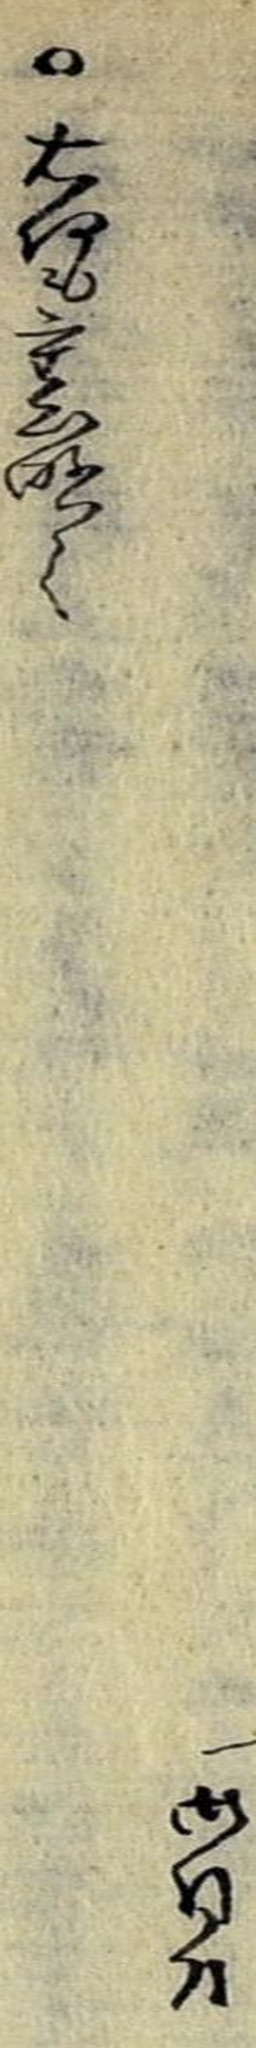○右何も重出略之
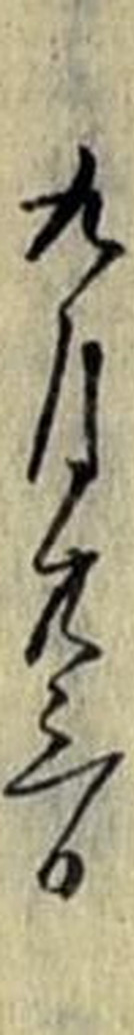九月廿三日
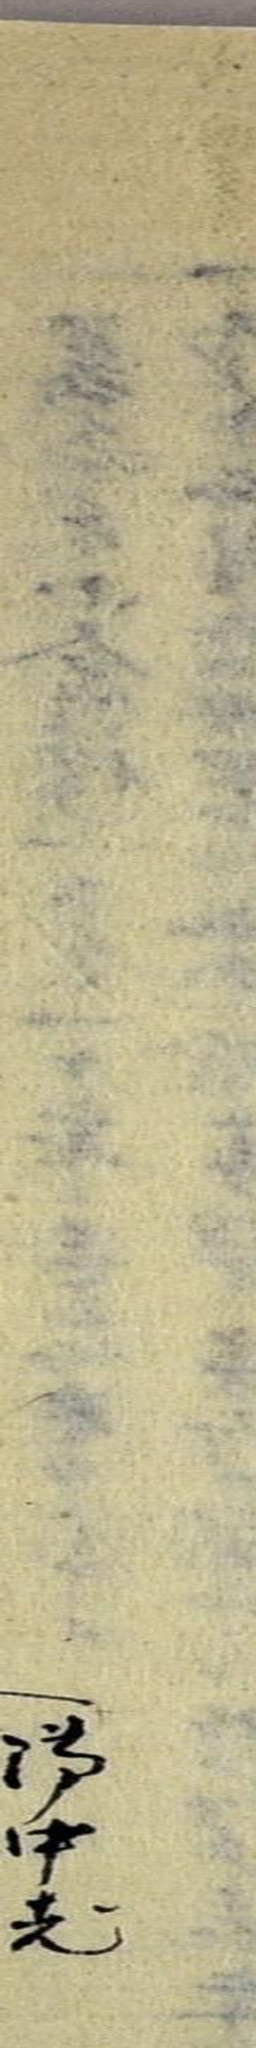御中老
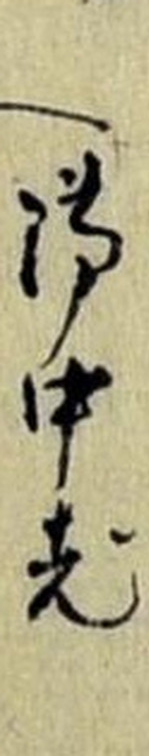御中老
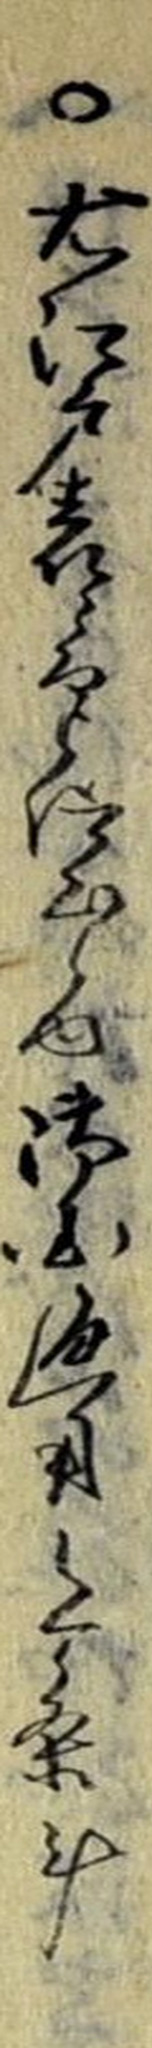○右江戸表に而被仰出之内御国通用之ヶ条斗
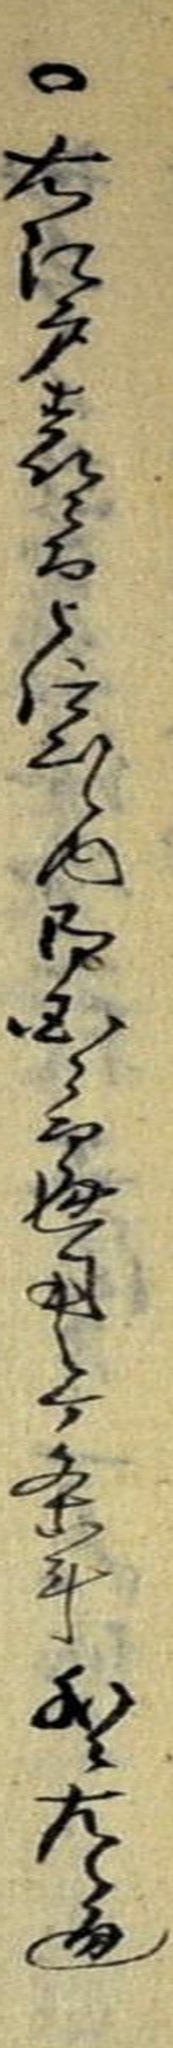○右江戸表に而被仰出候内御国に而通用之ヶ条斗外に左之通
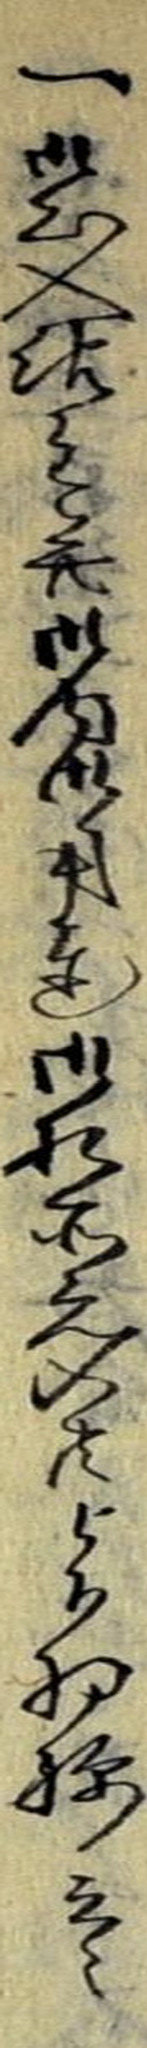一御出入銀主共并御内御用達御札所元〆共被下物綿云々
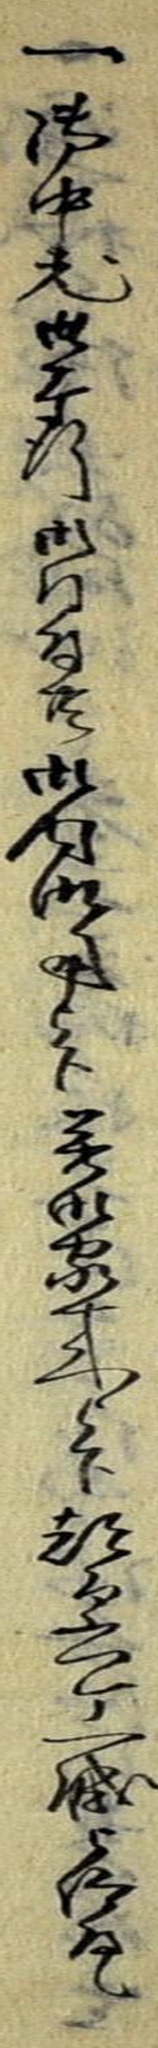一御中老御奉行御目付共へ御内御用被下并御家来被下都而六ヶ一減被仰付候
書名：命令之部 四
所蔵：福井県文書館 Fukui Prefectural Archives
